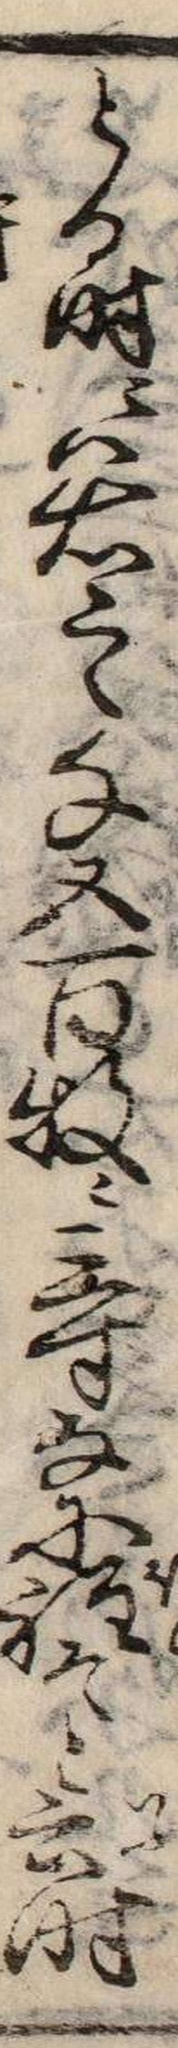とる時には右の千五百枚に三寸なに程そと云時
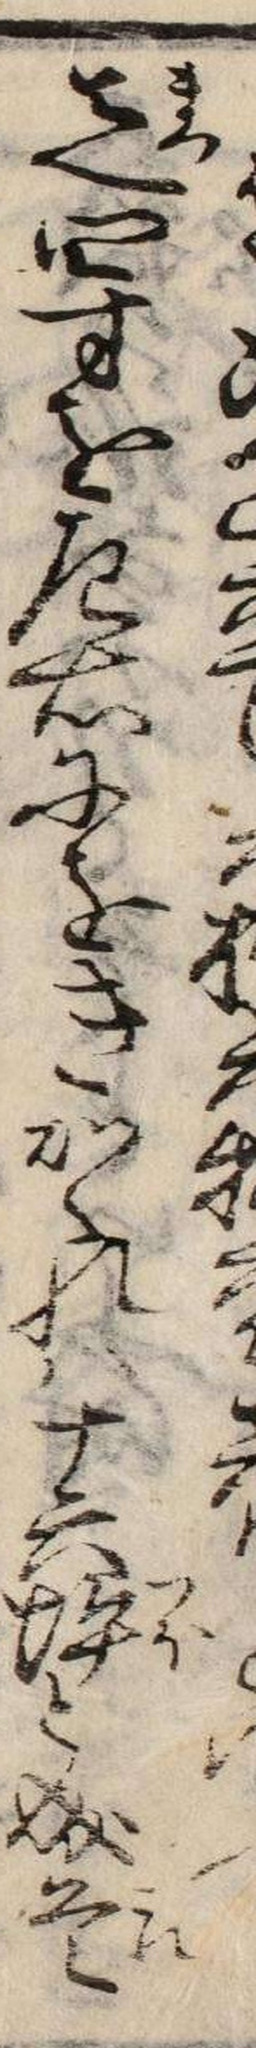先四寸を左右にをきかくれは十六坪と成是
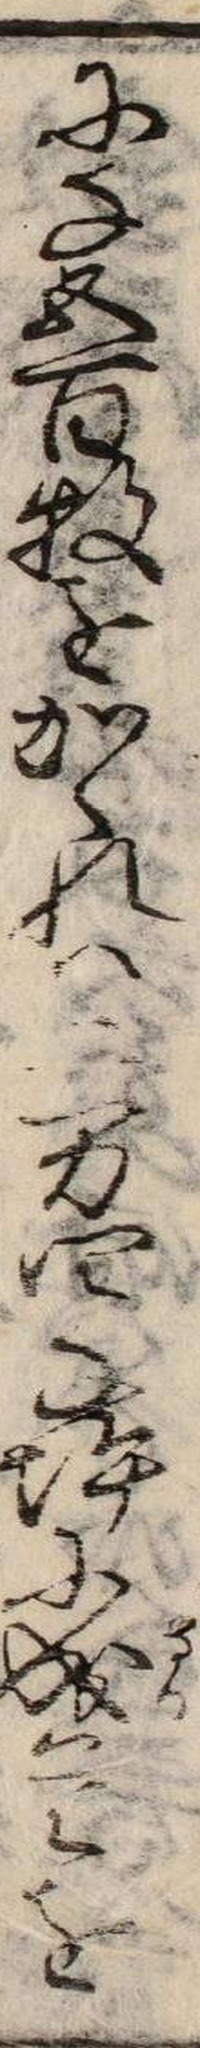に千五百枚をかくれは二万四千坪に成是を
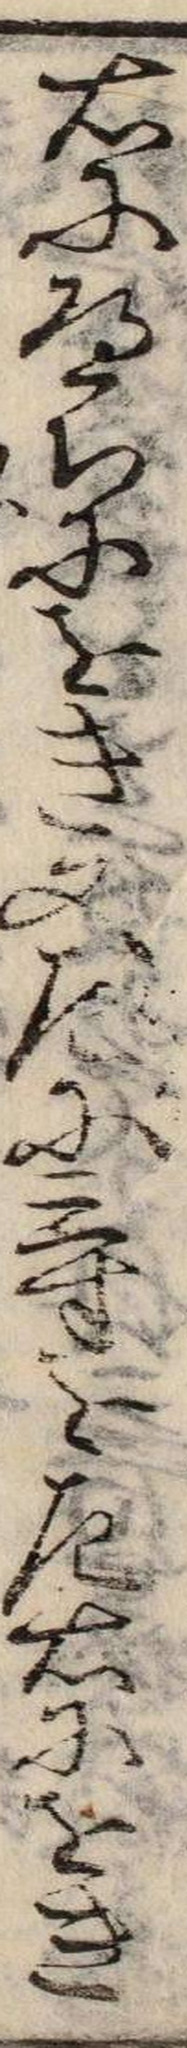右にへちにをき又左に三寸を左右にをき
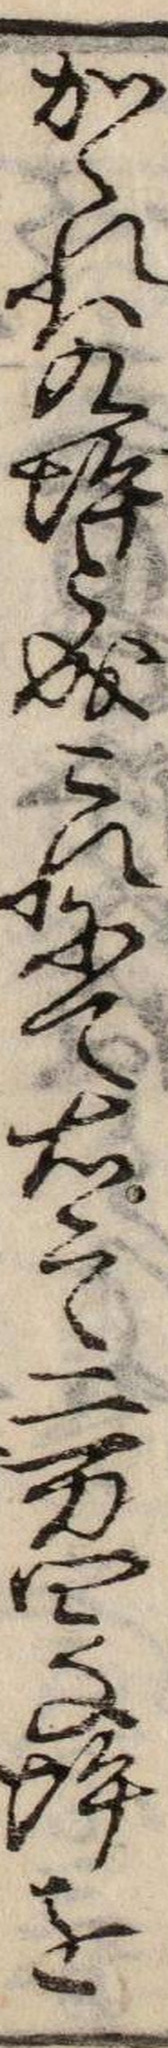かくれは九坪と成これにて右の二万四千坪を
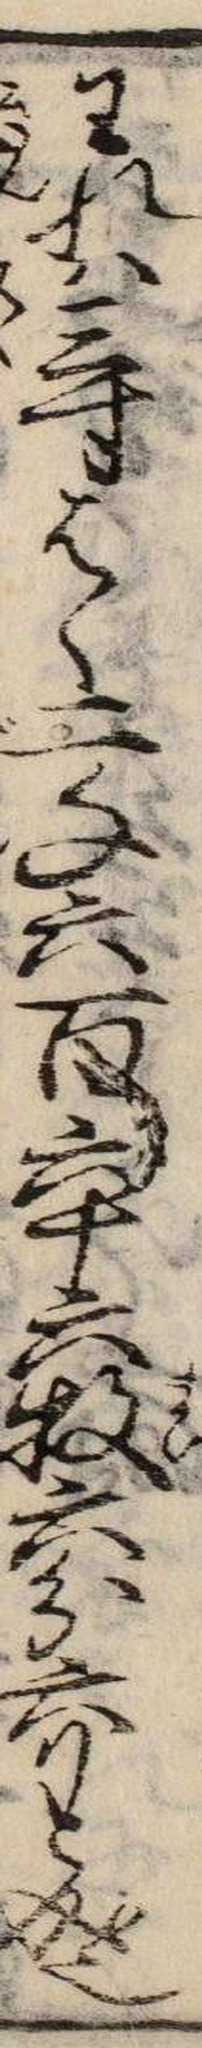われは三寸はく二千六百六十六枚六分六りと成也
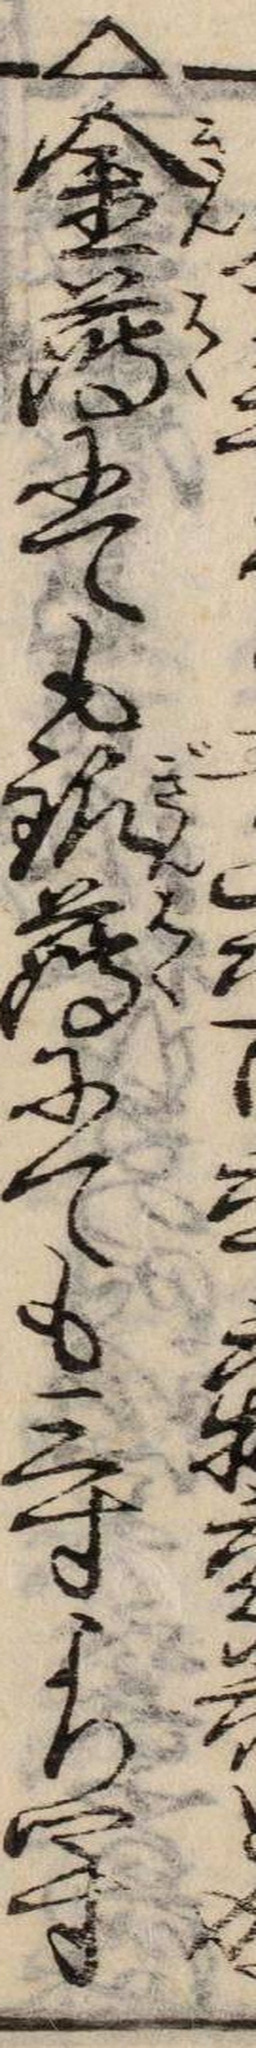△金薄にても銀薄にても三寸より四寸
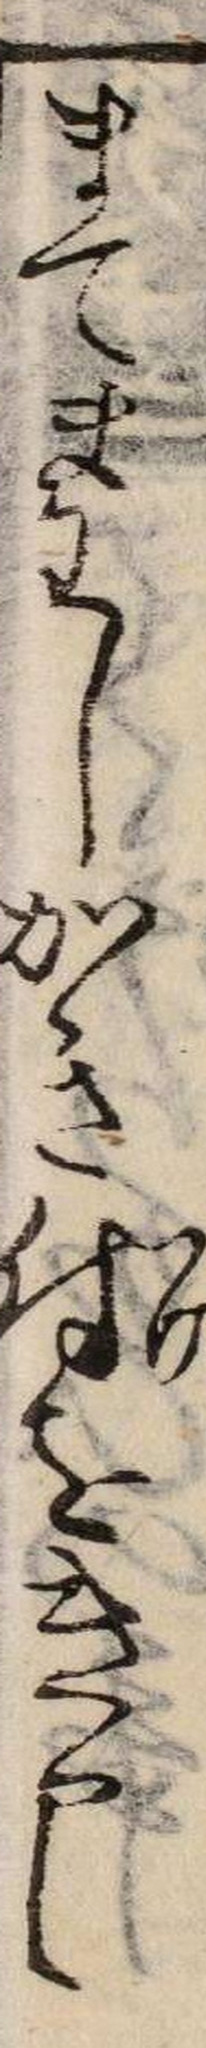まてまわしかき付をき申候
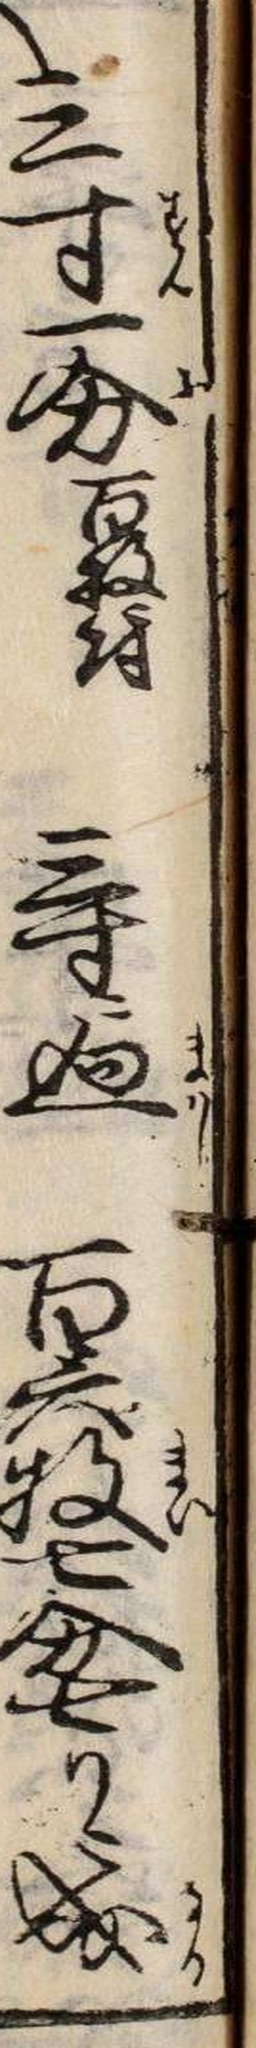三寸一分百枚に付三寸に廻百六枚七分七りに成
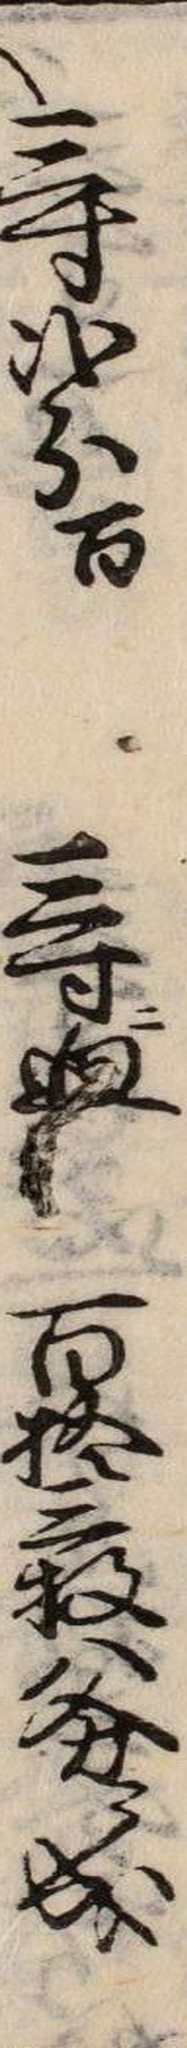三寸弐分百三寸に廻百拾三枚八分に成
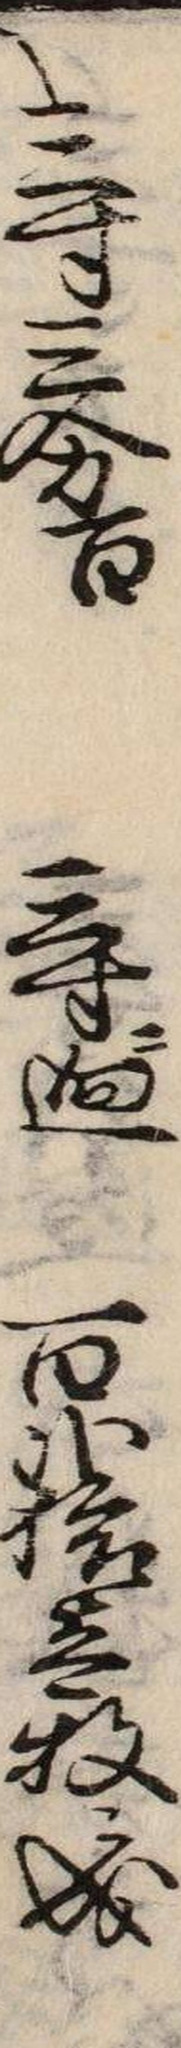三寸三分百三寸に廻百弐拾壱枚に成
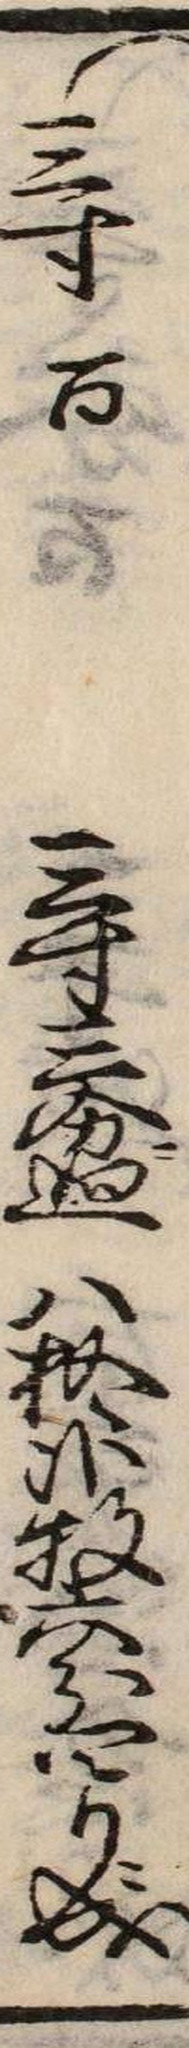三寸百三寸三分に廻八拾弐枚六分四りに成
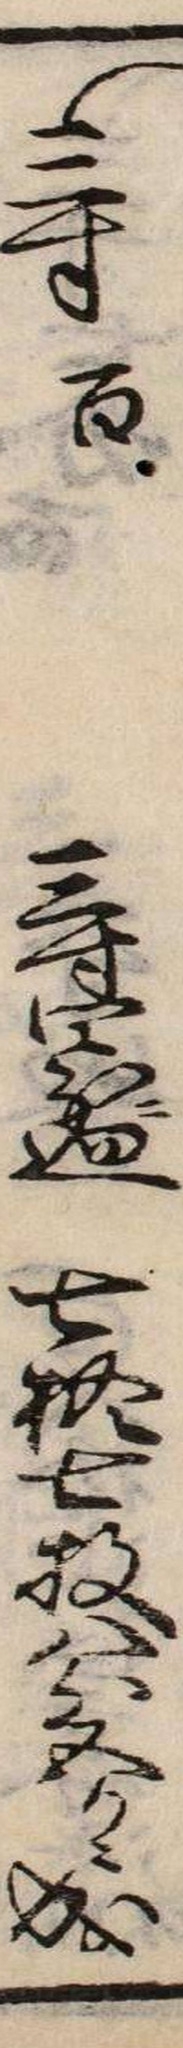三寸百三寸四分に廻七拾七枚八分五りに成
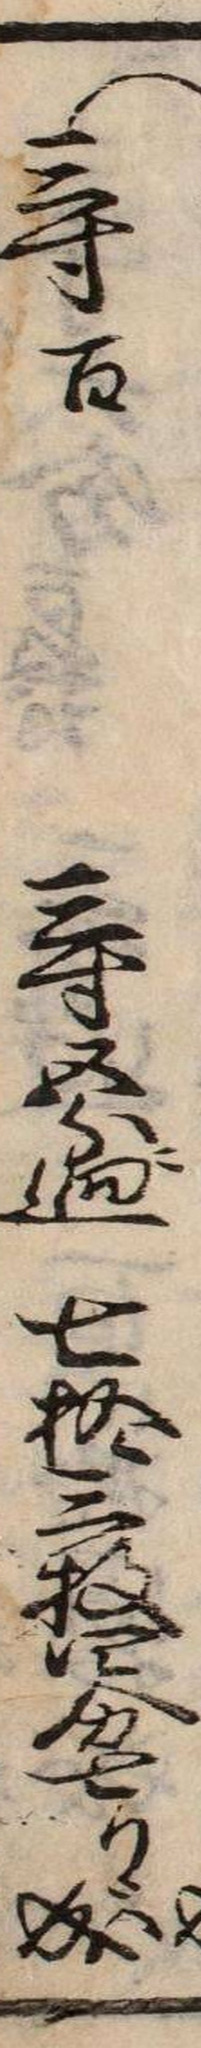三寸百三寸五分に廻七拾三枚四分七りに成

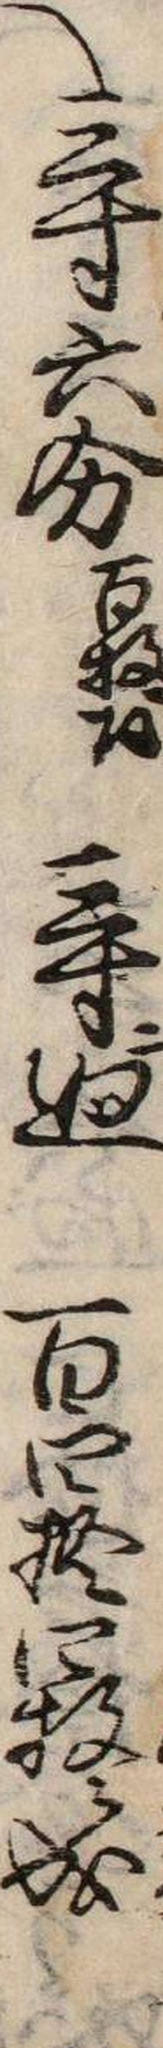三寸六分百枚に付三寸に廻百四拾四枚に成
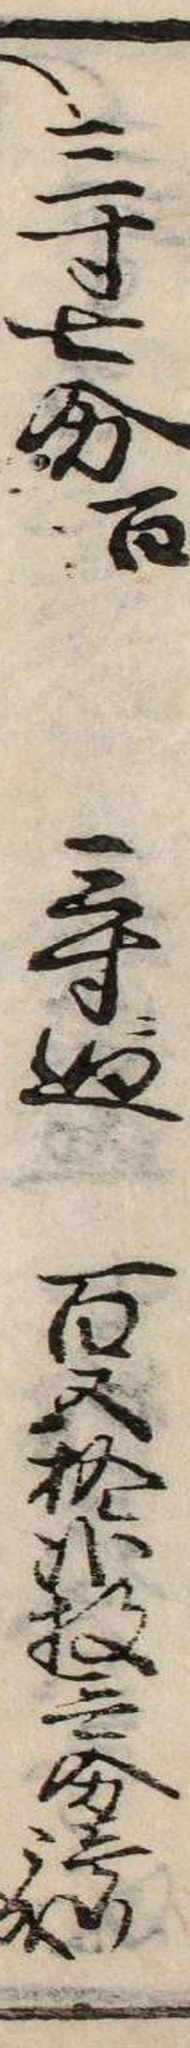三寸七分百三寸に廻百五拾弐枚壱分壱りに成
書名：塵劫記（寛永11年自跋、京都府立京都学・歴彩館追貴8）
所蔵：京都府立京都学・歴彩館 国文学研究資料館
